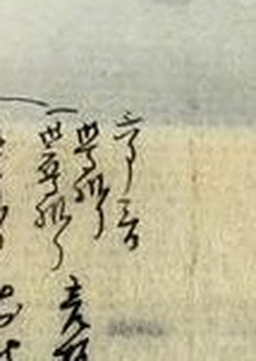六月三日
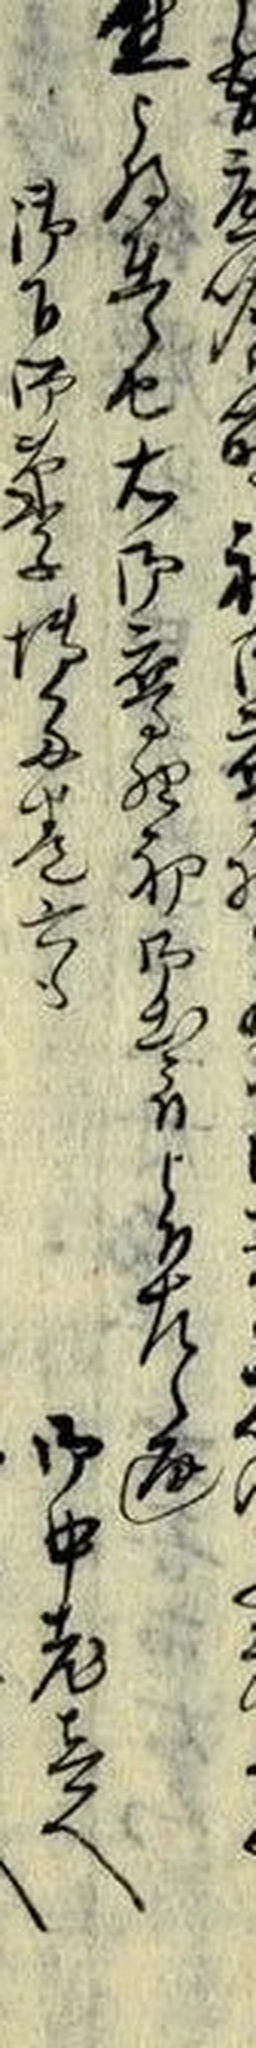御下御菓子博多巻六ツ御中老壱人
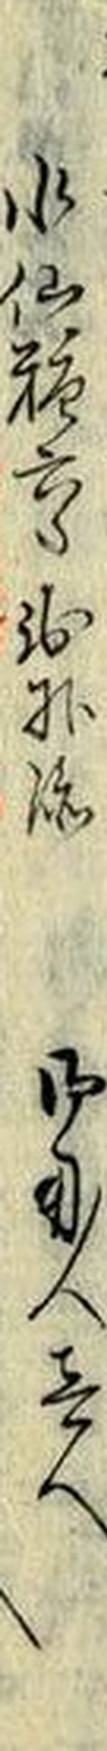水仙糖六ツ氷添御用人壱人
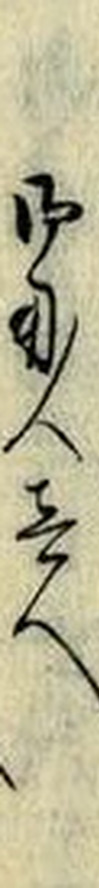御用人壱人
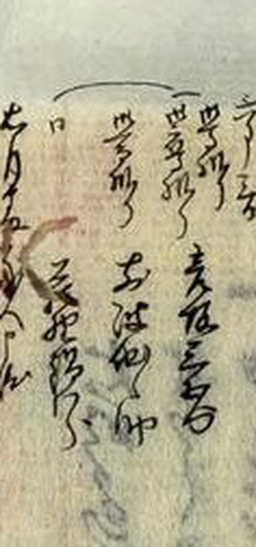御馬掛り前波他之助
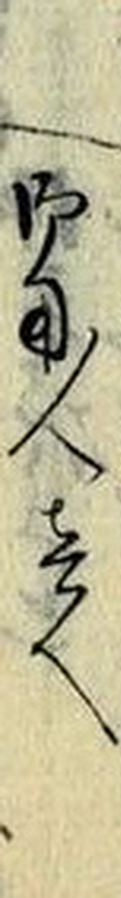御用人壱人
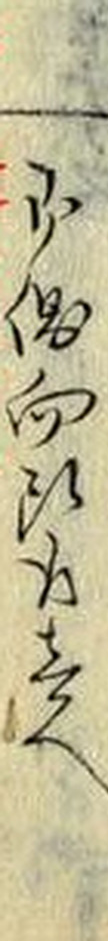御側向頭取壱人
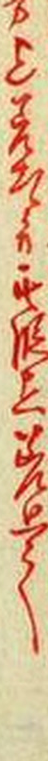同人と差出候由其段申上差上之
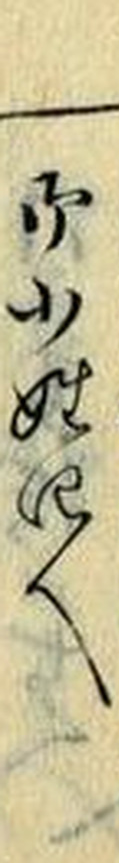御小姓頭取
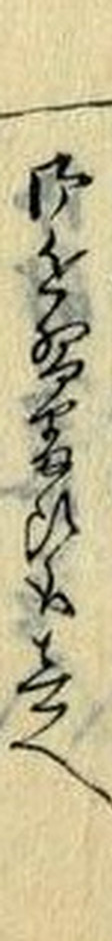御近習番頭取壱人
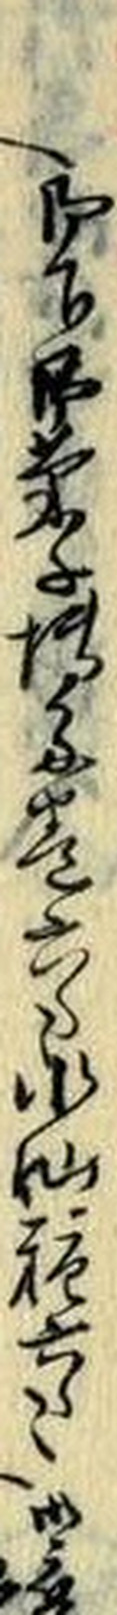御下御菓子博多巻六ツ水仙糖六ツツヽ
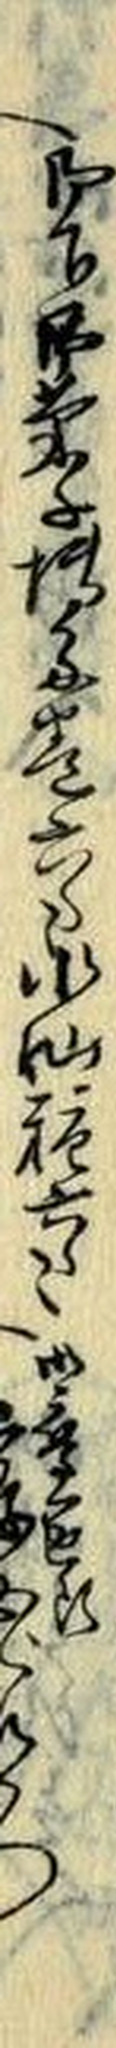御下御菓子博多巻六ツ水仙糖六ツツヽ

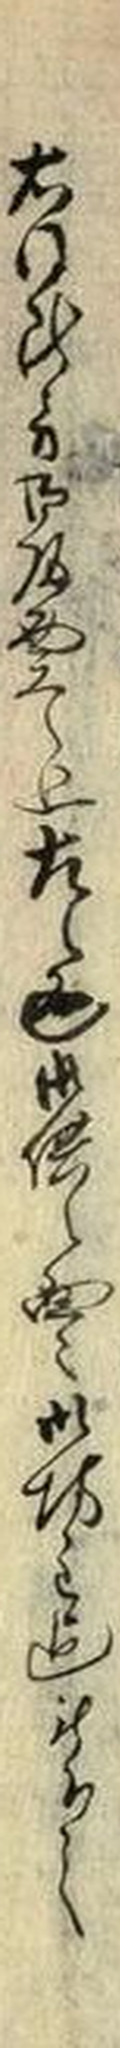右同断ニ付御帰殿之上左之通御供之面々御坊主迄被下之
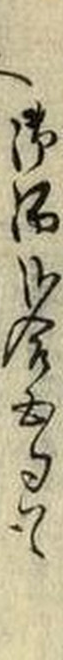御酒弐合五勺ツゝ
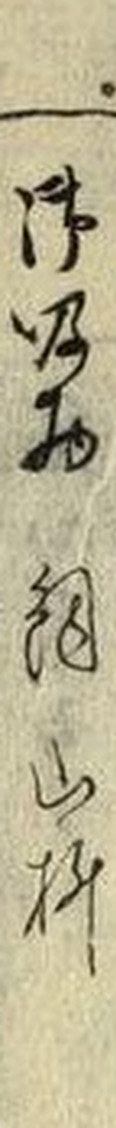御吸物鯛山枡
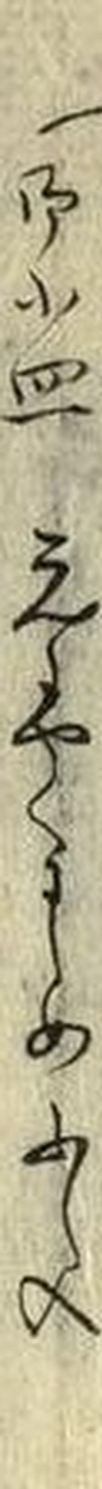御小皿こんにやくにしめふし入
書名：少傅日録抄（斉承付側向頭取日記、在国）
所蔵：福井県文書館 Fukui Prefectural Archives
